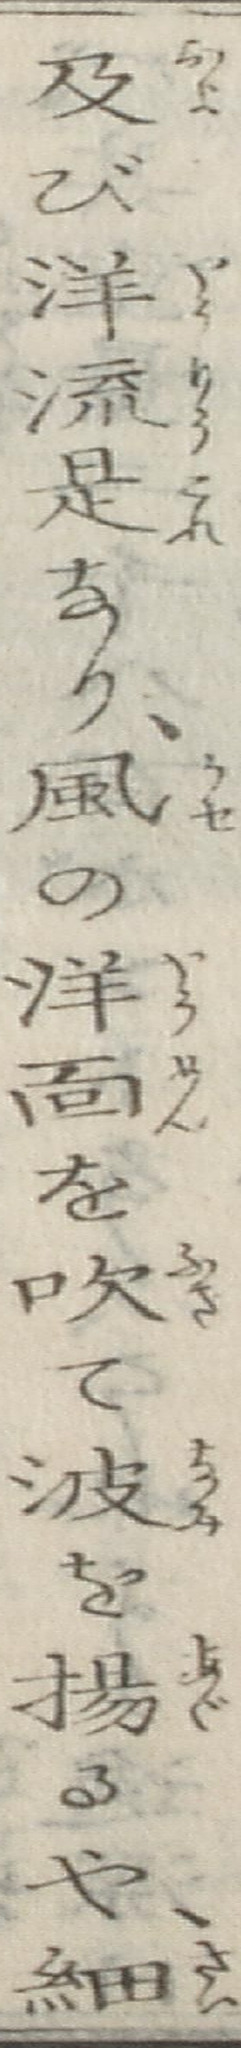及び洋流是なり、風の洋面を吹て波を揚るや、細
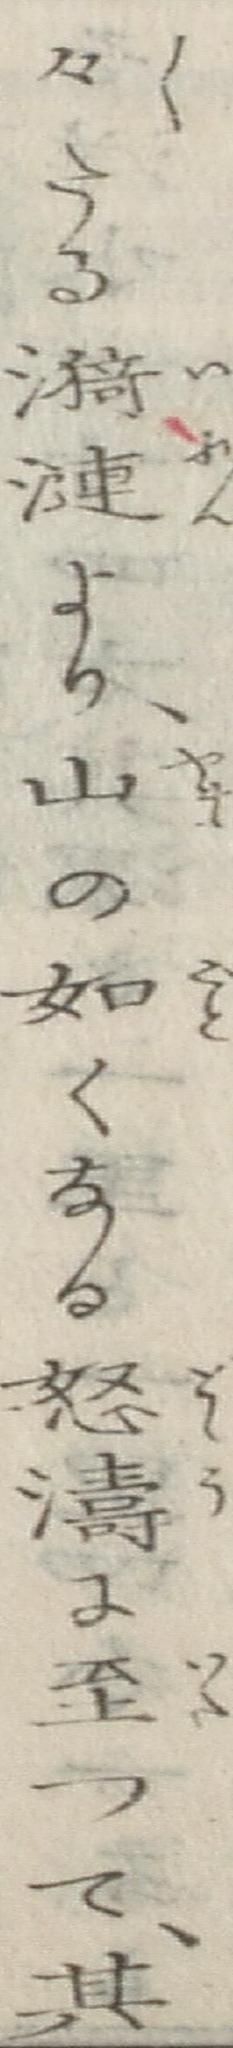々たる漪漣より、山の如くなる怒濤に至つて、其
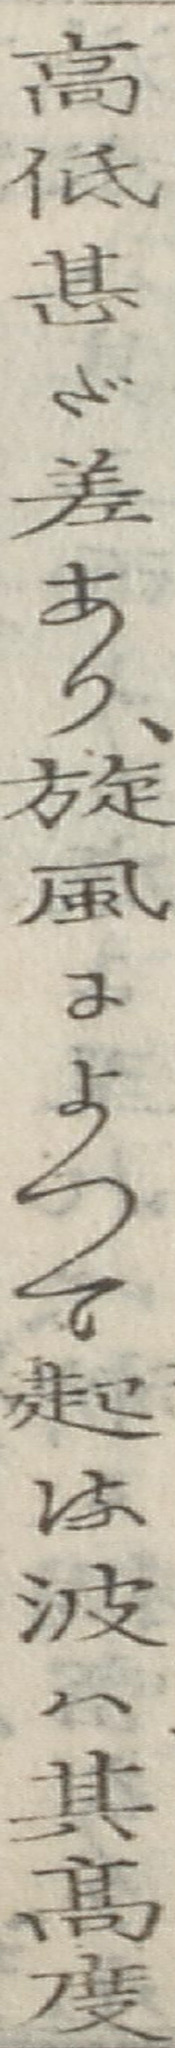高低甚だ差あり、旋風によつて起る波は、其高度
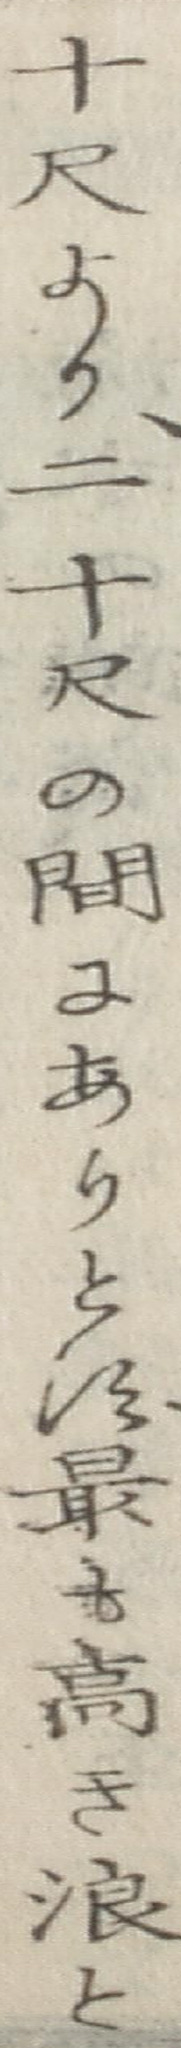十尺より、二十尺の間にありとす、最も高き浪と
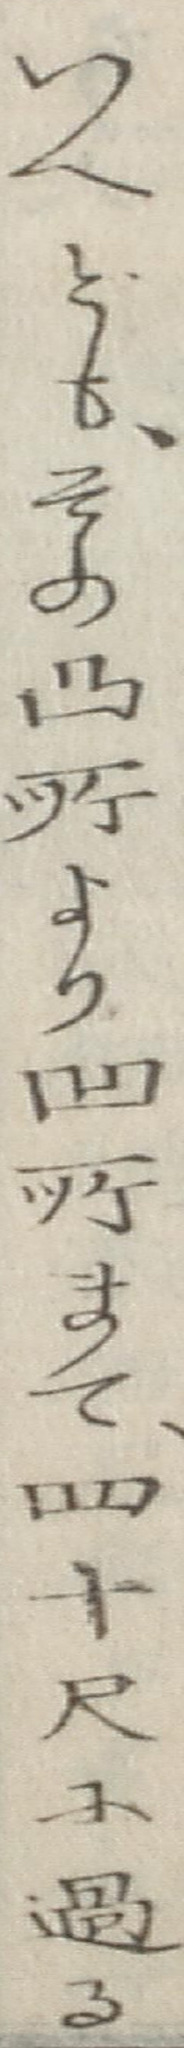いへども、その凸所より凹所まて、四十尺に過る
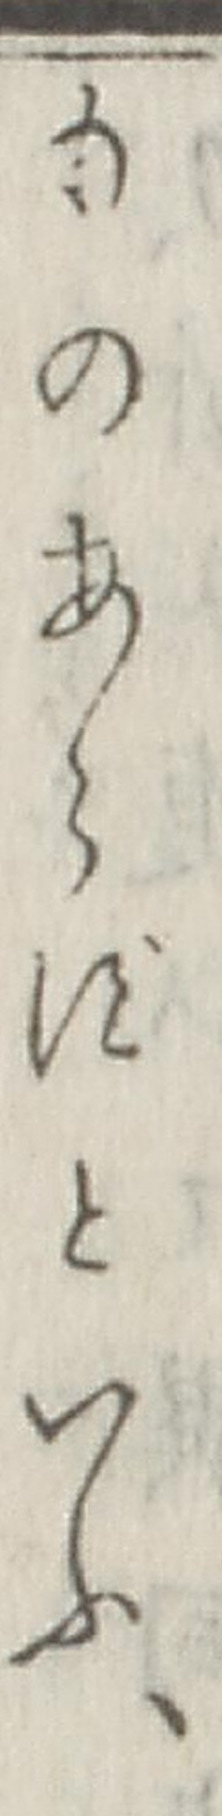ものあらずといふ、
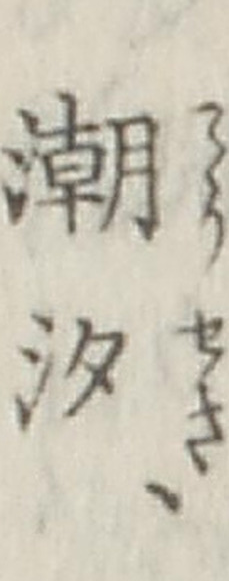潮汐、
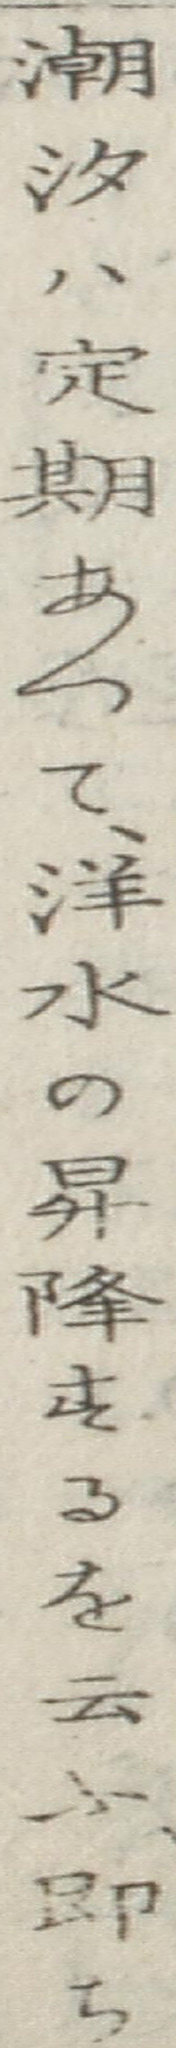潮汐は定期あつて、洋水の昇降するを云ふ、即ち
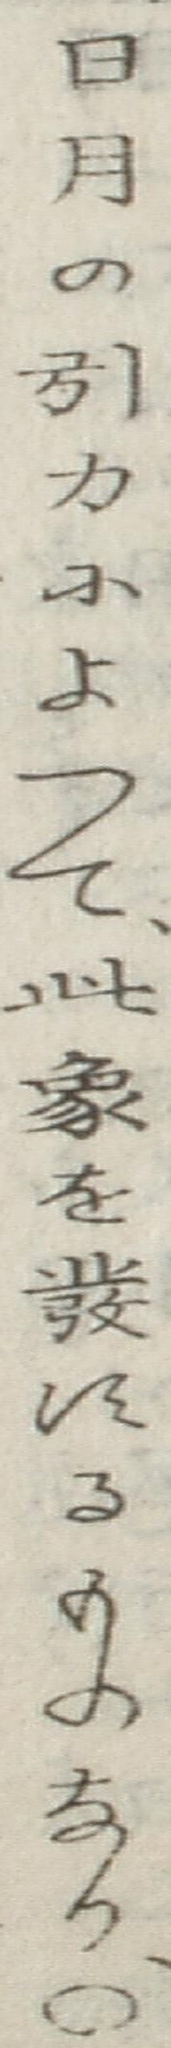日月の引力によつて、此象を発するものなり、○
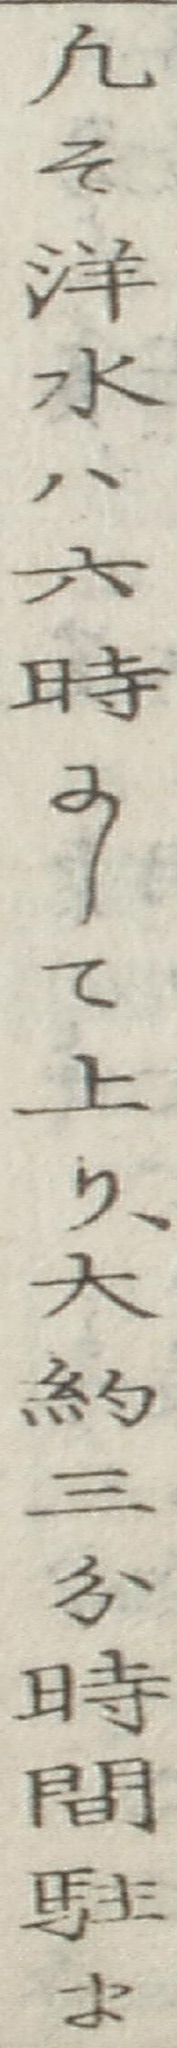凡そ洋水は六時にて上り、大約三分時間駐ま
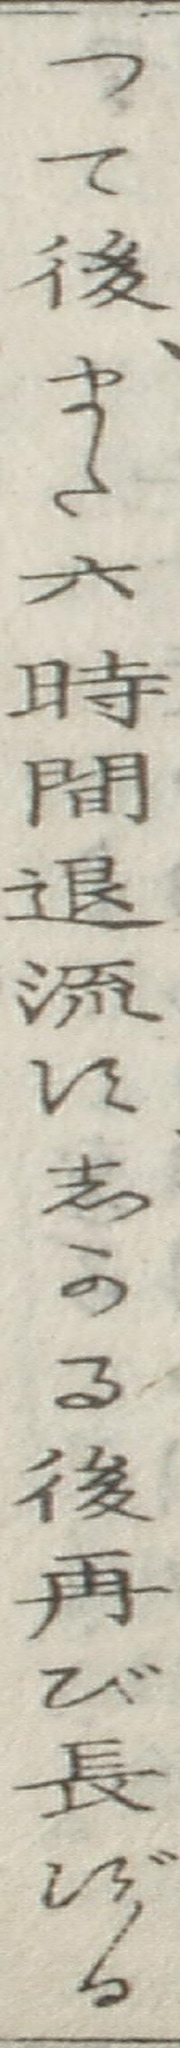つて後、また六時間退流す、しかる後再び長ずる
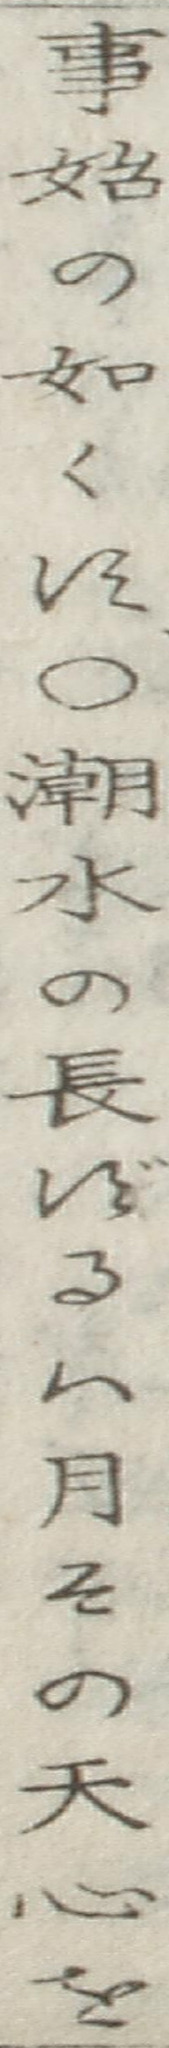事始の如くす、○潮水の長ずるは月その天心を
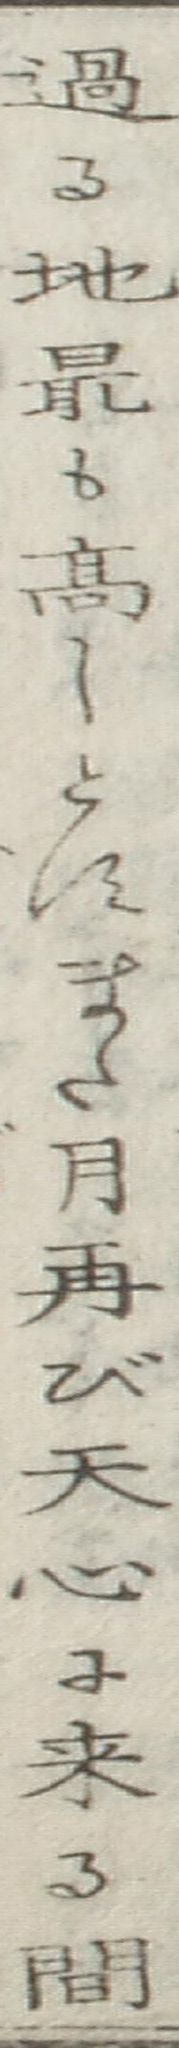過る地最も高しとす、また月再び天心に来る間
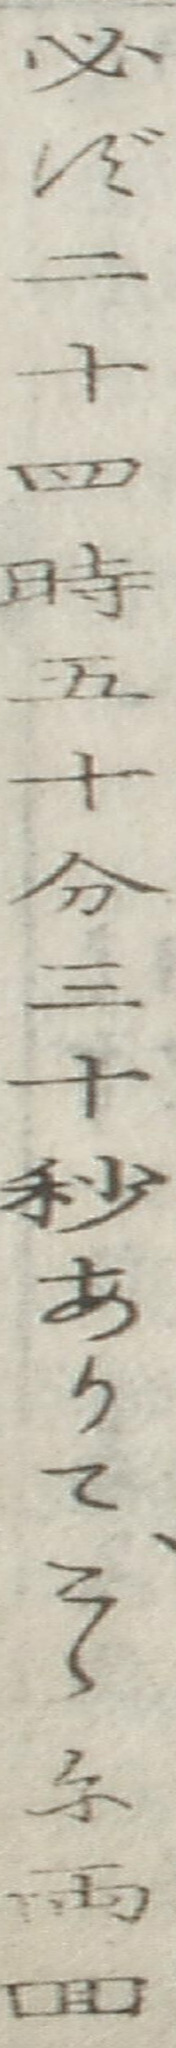必ず二十四時五十分三十秒ありて、こゝに両回

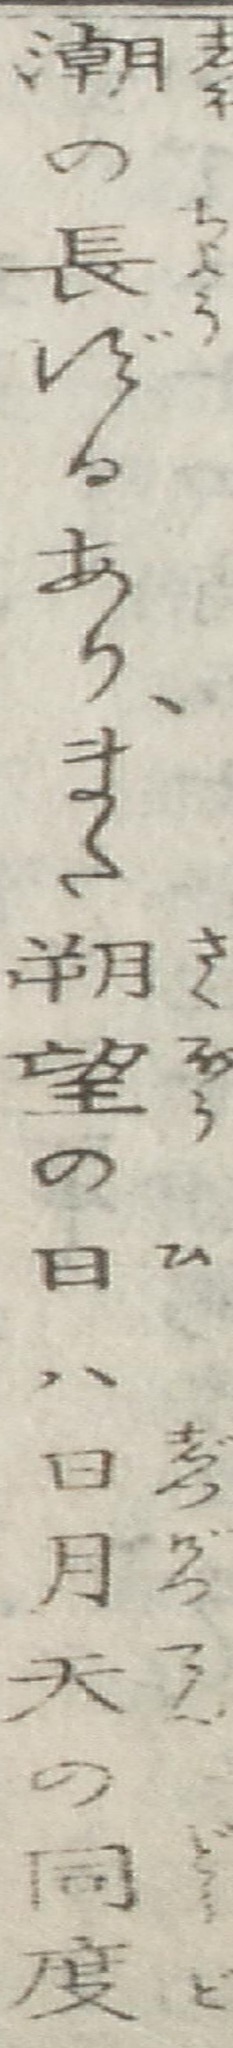潮の長ずるあり、また朔望の日は日月天の同度
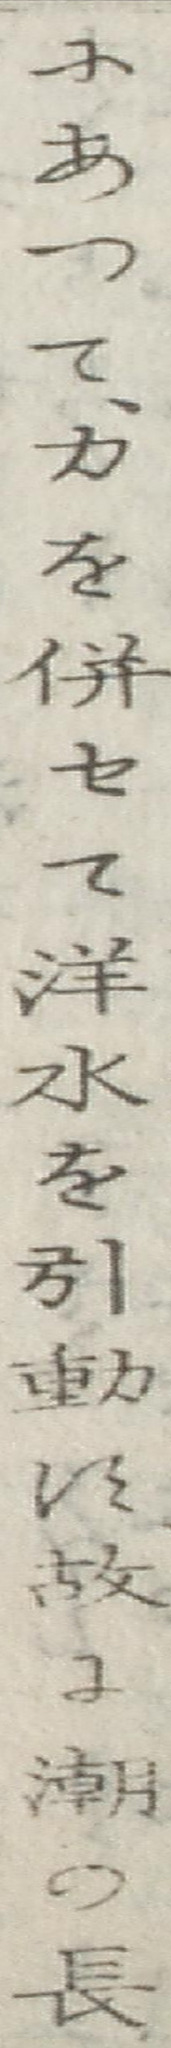にあつて、力を併せて洋水を引動す、故に潮の長
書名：訓蒙　天然地理學　中
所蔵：東京大学地震研究所図書室 Earthquake Research Institute Library, The University of Tokyo, JAPAN
